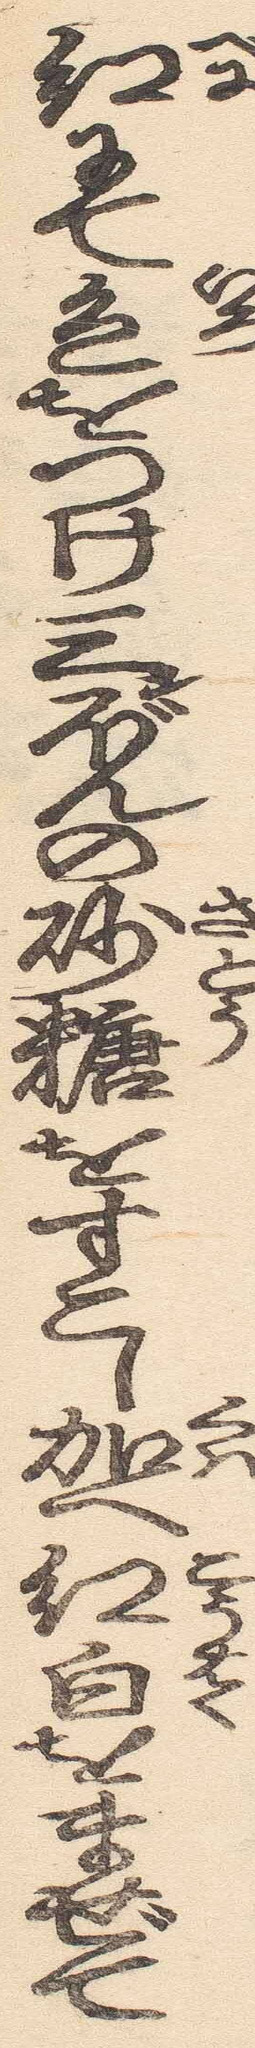紅にて色をつけ三ぼんの砂糖をすこし加へ紅白をまぜて
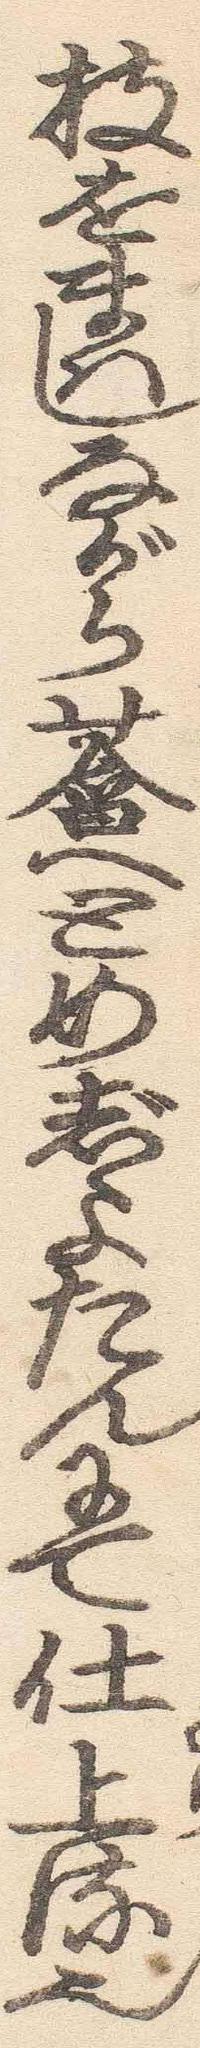枝をまはしながら莟へとめじよたんにて仕上る也
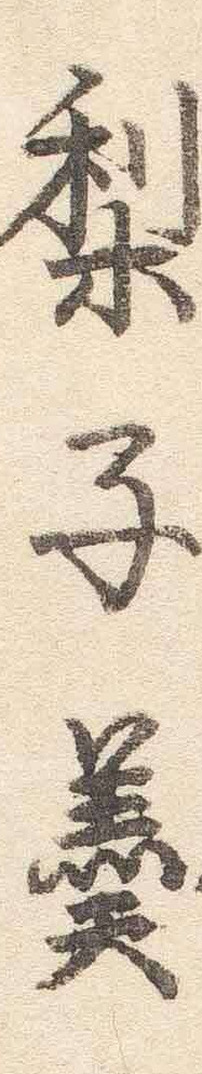梨子羹
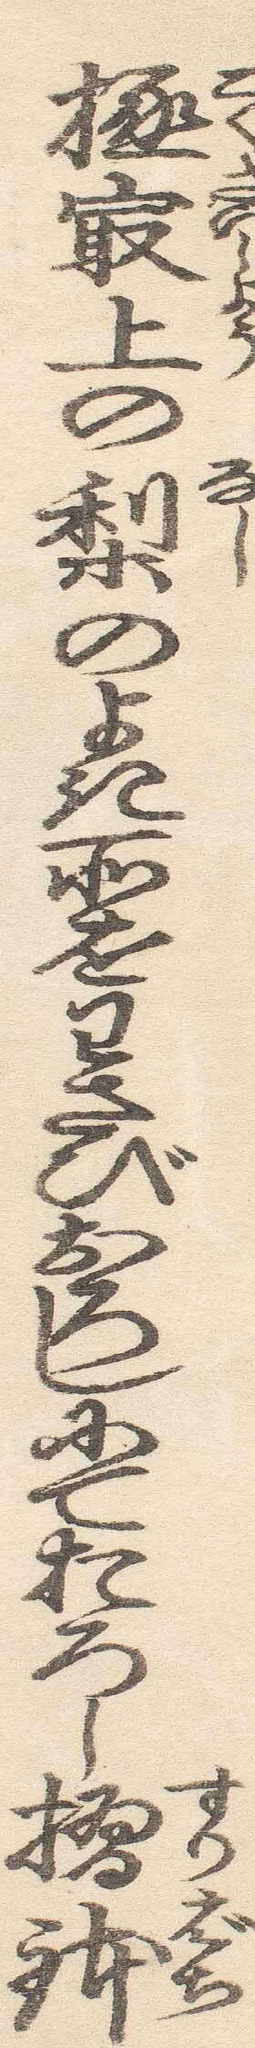一極最上の梨のよき所をわさびおろしにておろし擂鉢
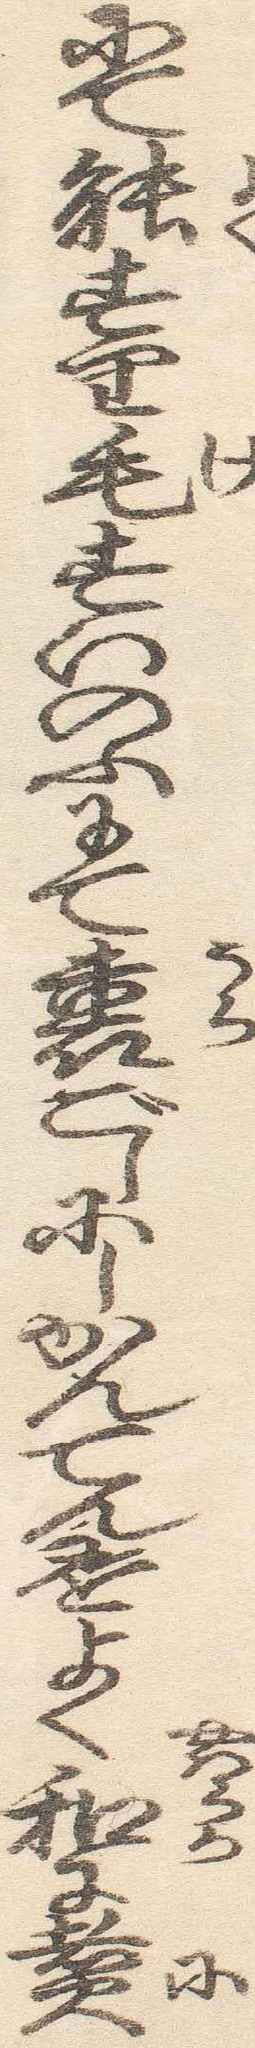にて能すり毛すいのふにて裏ごしにしかんてんをよく和に煮
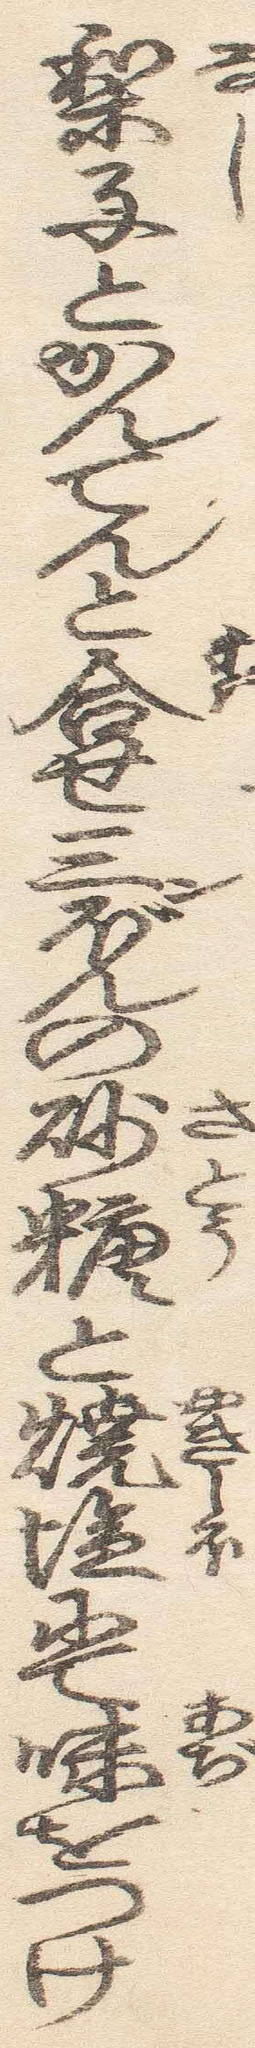梨子とかんてんと合せ三ぼんの砂糖と焼塩にて味をつけ
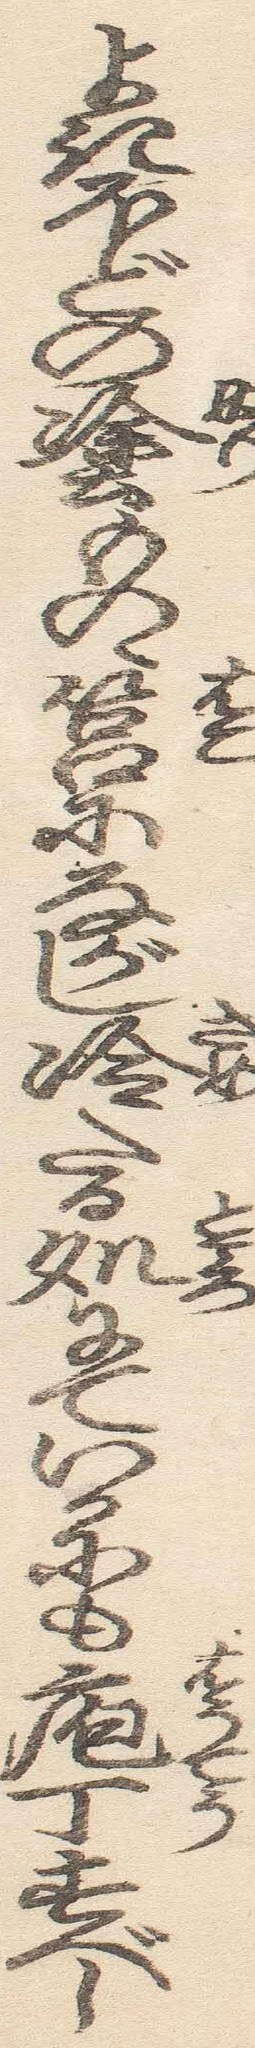よきほどの塗ものゝ筥にながし冷たる処にていかにも庖丁すべし
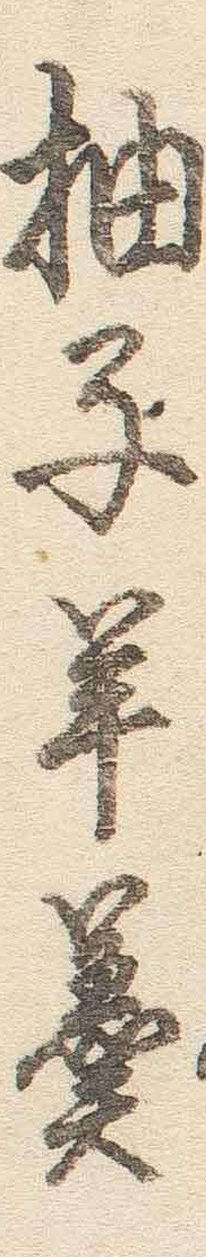柚子羊羹
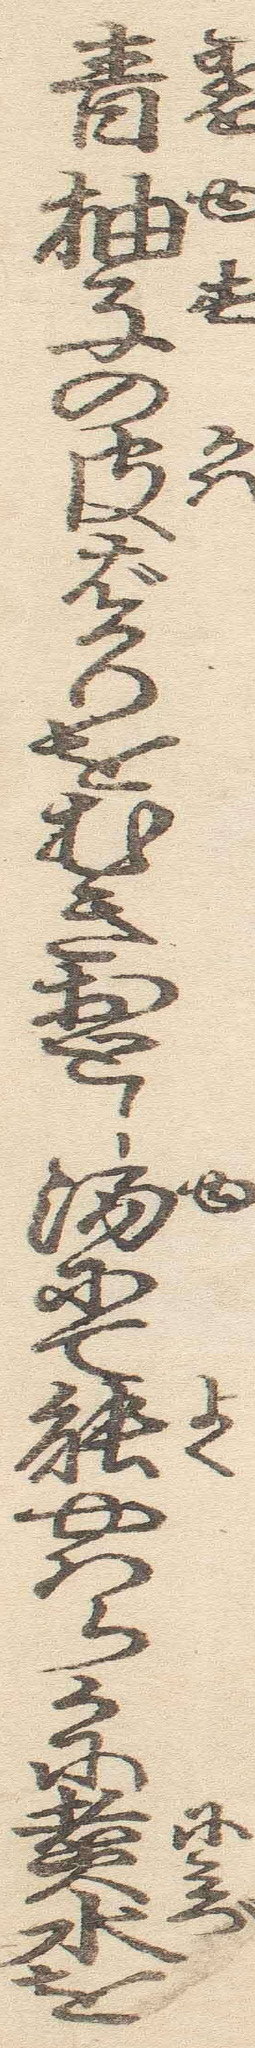青柚子の皮ばかりをむきおとし湯にて能やはらかに煮水を
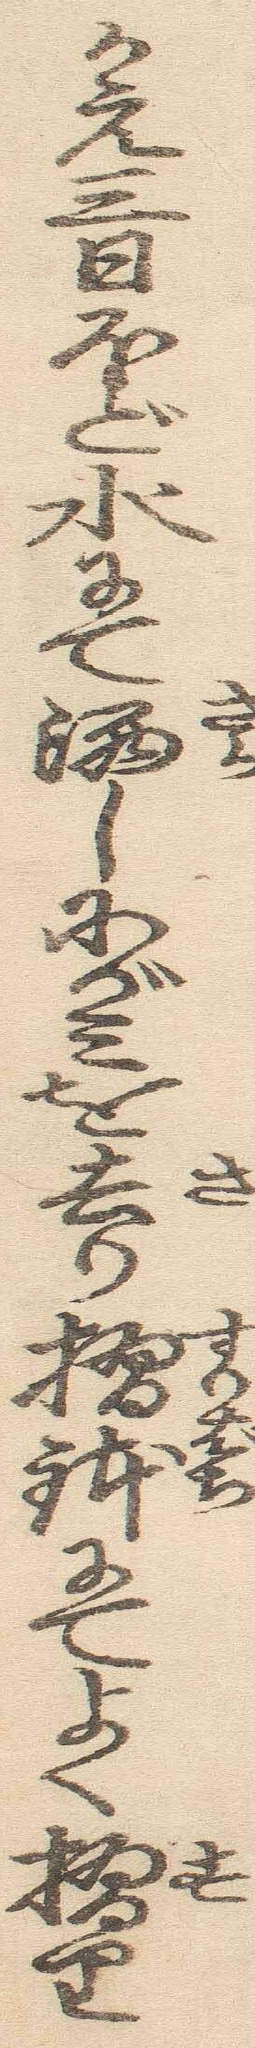かえ三日ほど水にて洒しにがみを去り擂鉢にてよく摺り

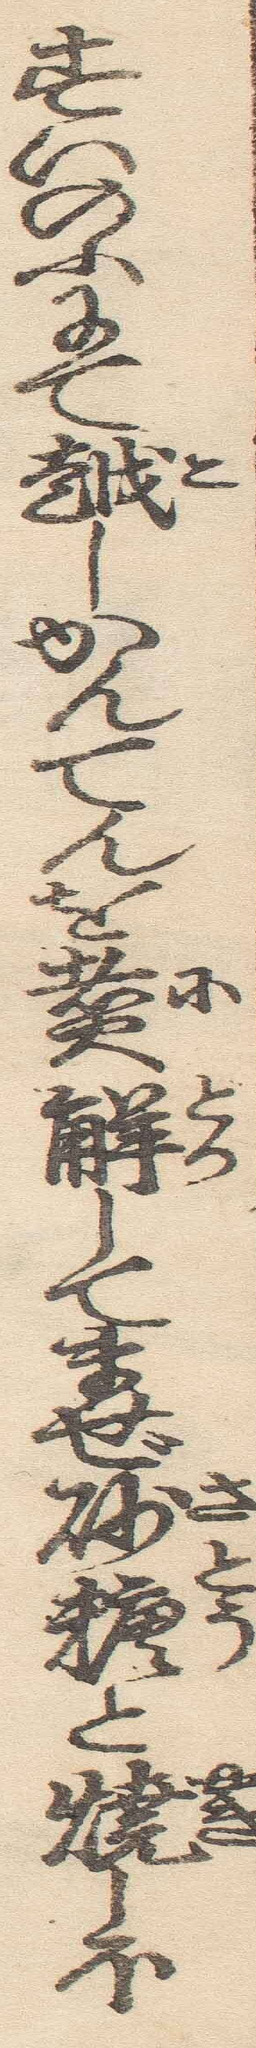すいのふにて越しかんてんを煮鮮してまぜ砂糖と焼しほ
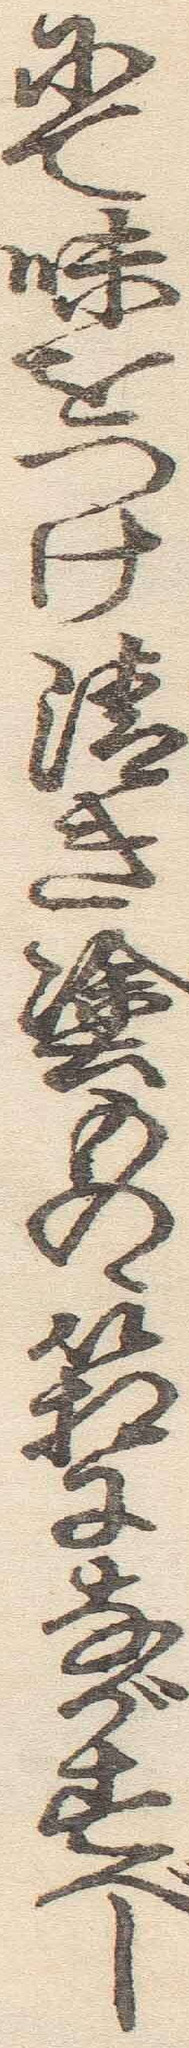にて味をつけ清き塗もの箱にながすべし
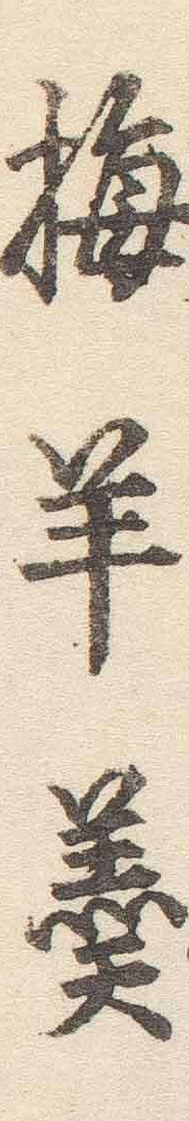梅羊羹
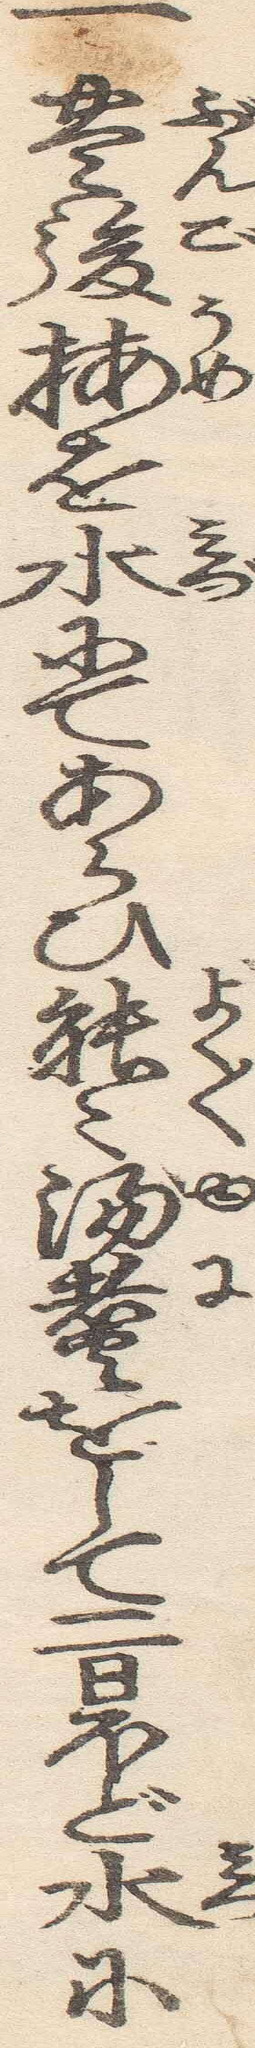一豊後梅を水にてあらひ能々湯煮をして二日ほど水に
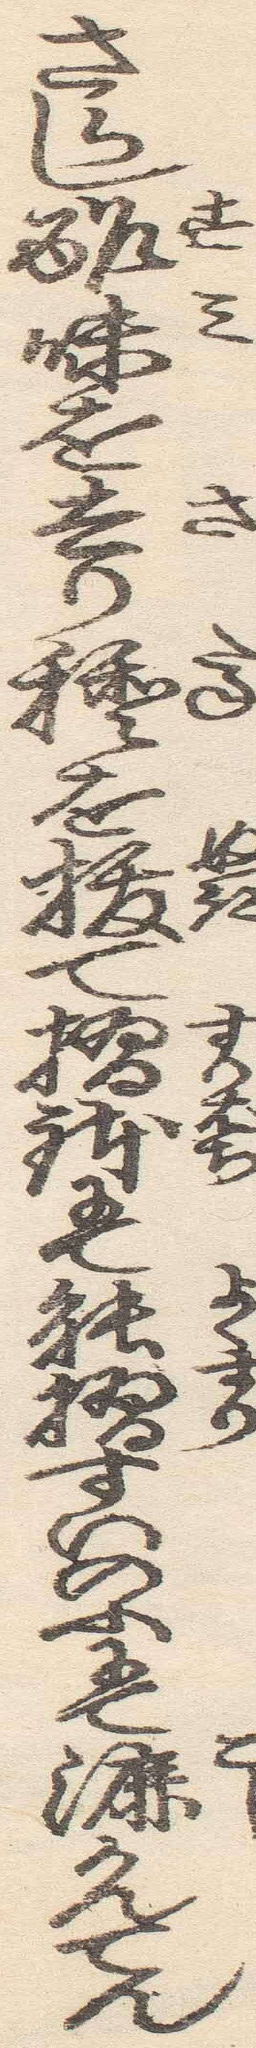さらし酢味を去り種を抜て擂鉢にて能擂すいのふにて漉かんてん
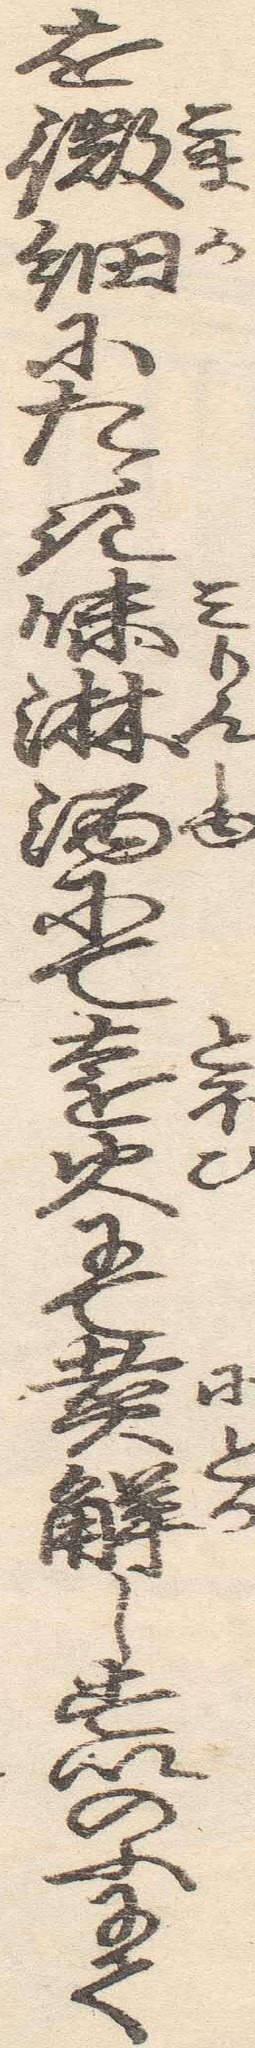を微細にたゝき味淋酒にて遠火にて煮鮮しすいのふにて
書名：料理通
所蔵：東京学芸大学附属図書館 国文学研究資料館
